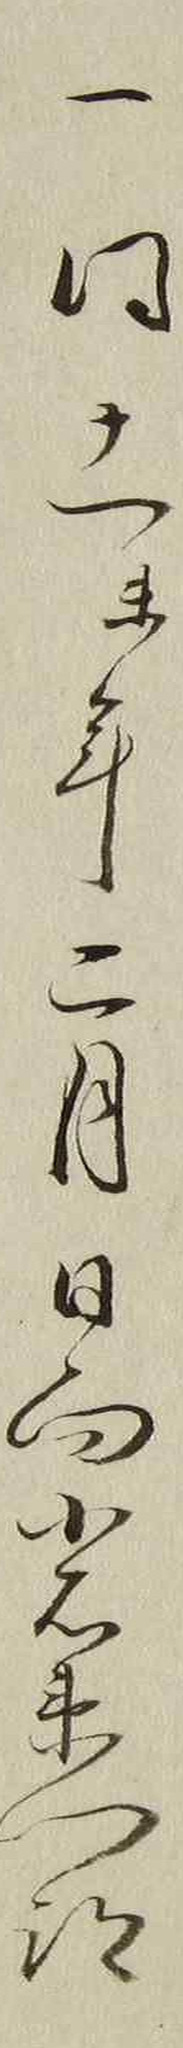一同十一未年二月日向小右衛門跡
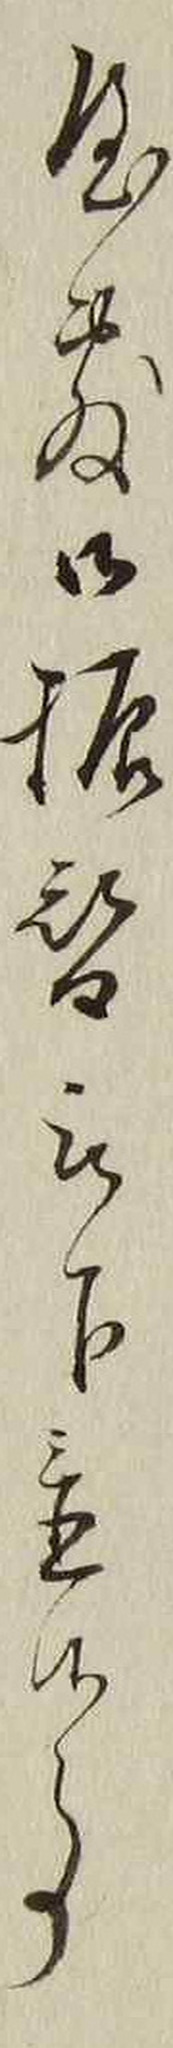屋敷御振替被下置候事
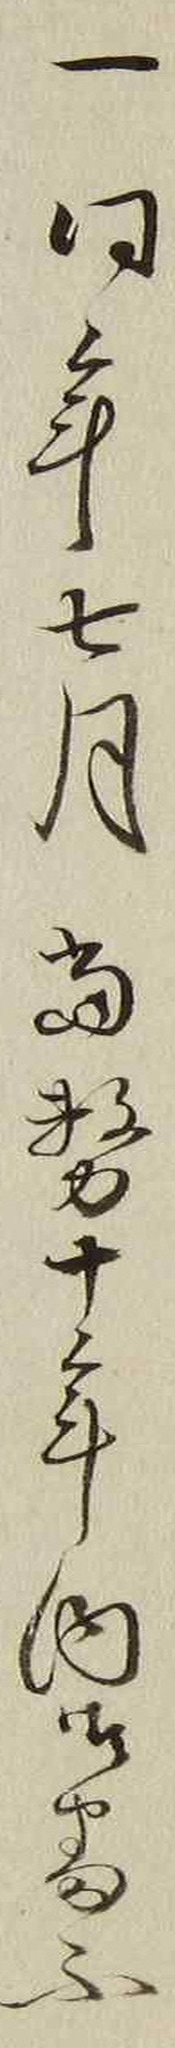一同年七月当務十年内御番不
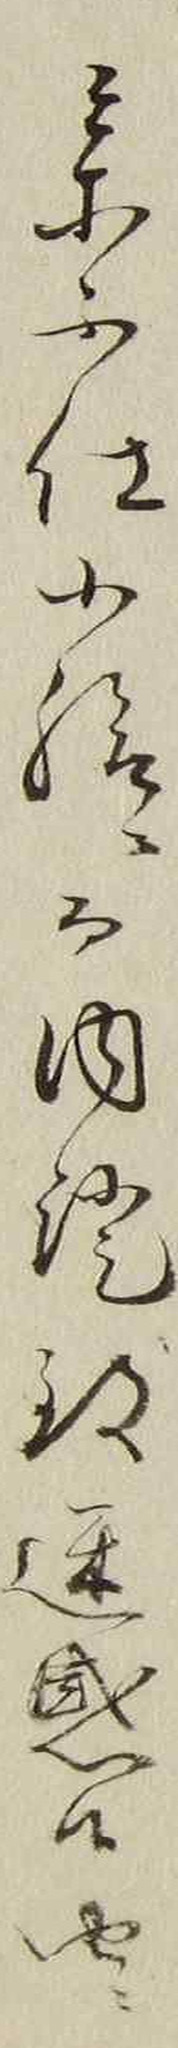参不仕小給ニ而内証致迷惑候由ニ
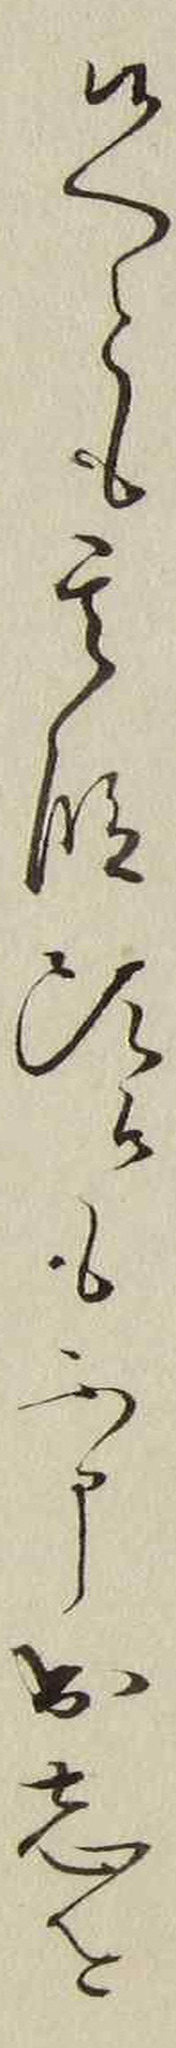候へとも其段頭江も不申出志を
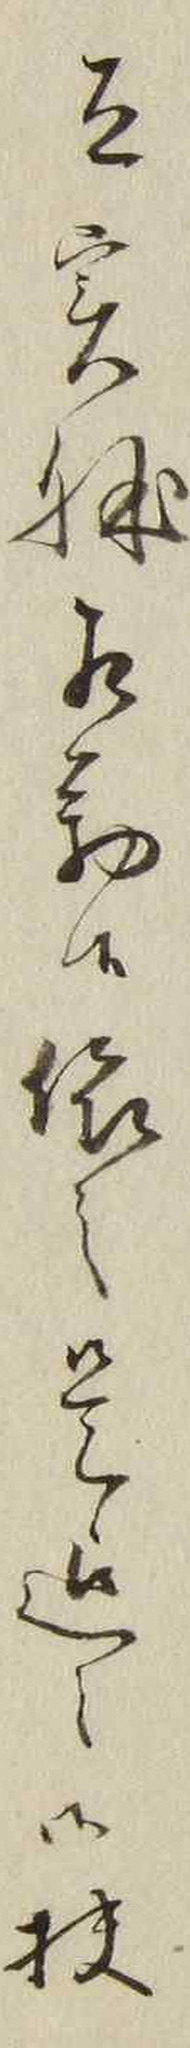立実体相勤候依之是迄之御扶
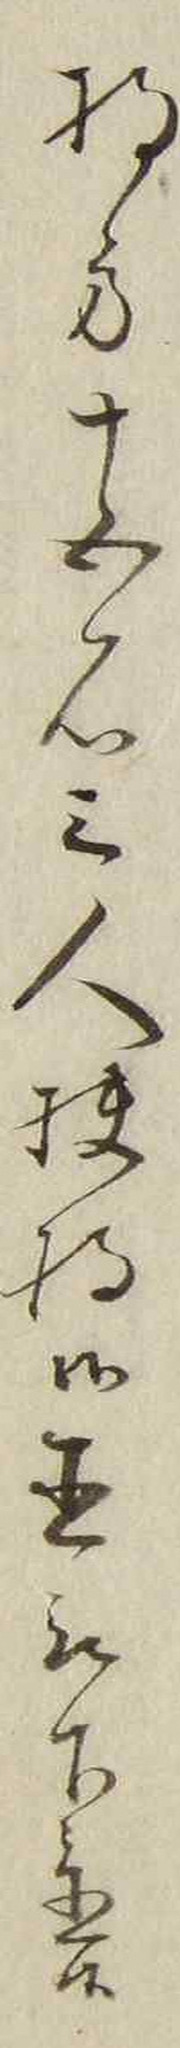持方十五石三人扶持御直被下置候

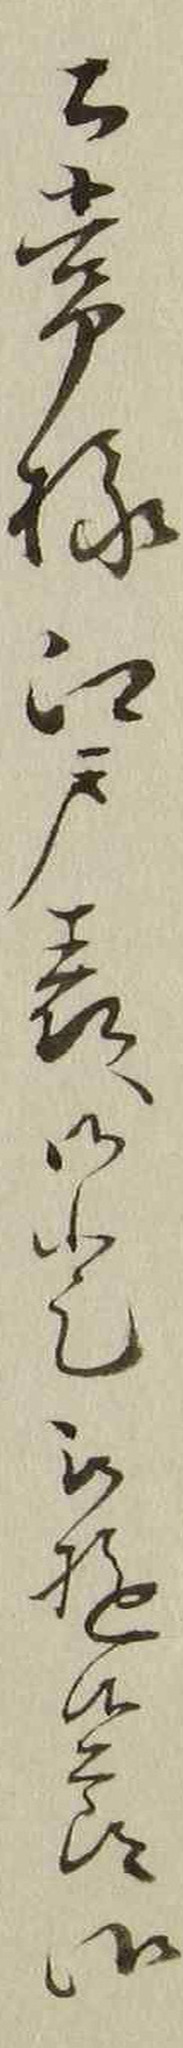土常様江戸表へ御登被遊候節御
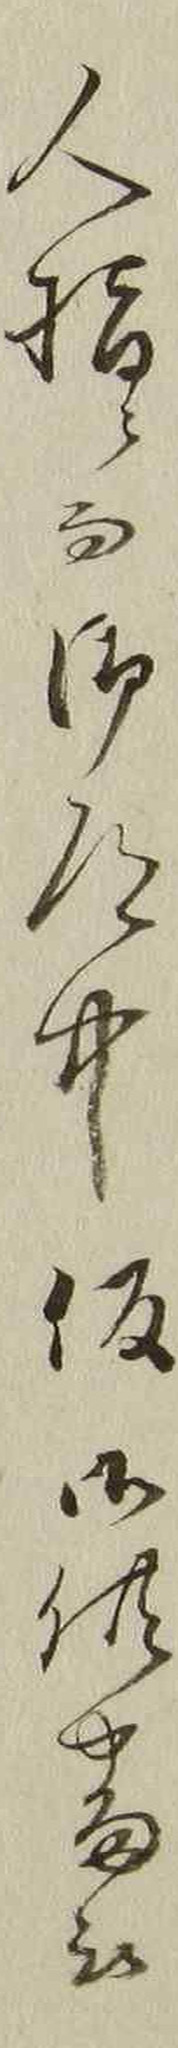人指ニ而御道中仮御供番被
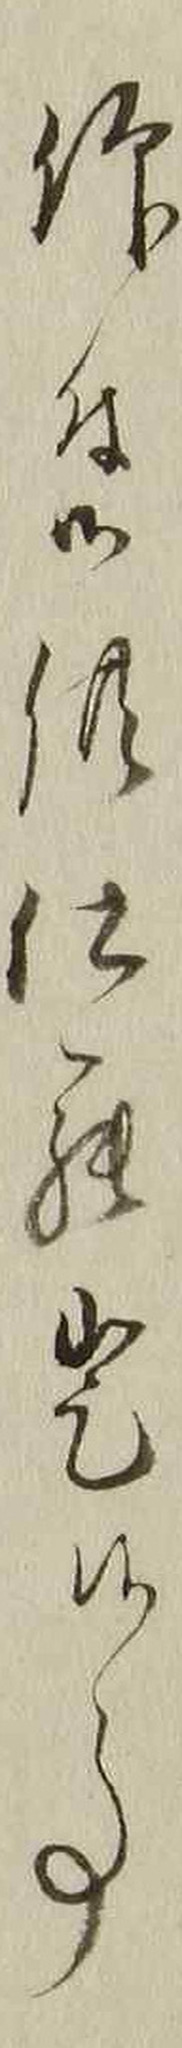仰付御供仕罷登候事
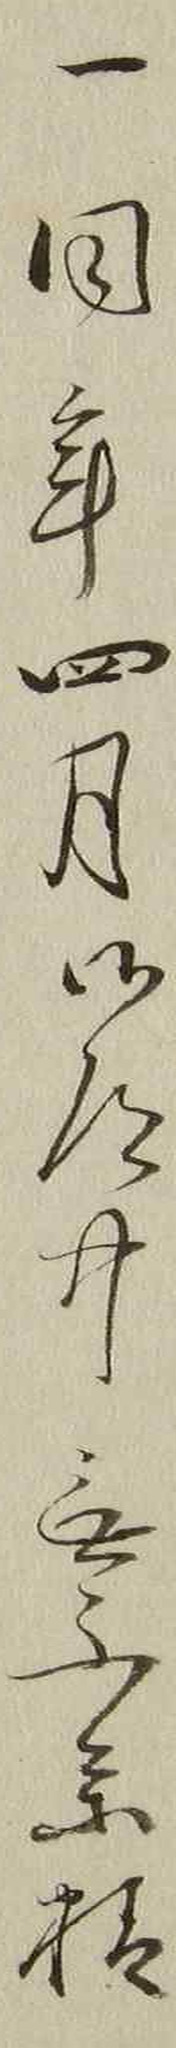一同年四月御道中無不参精
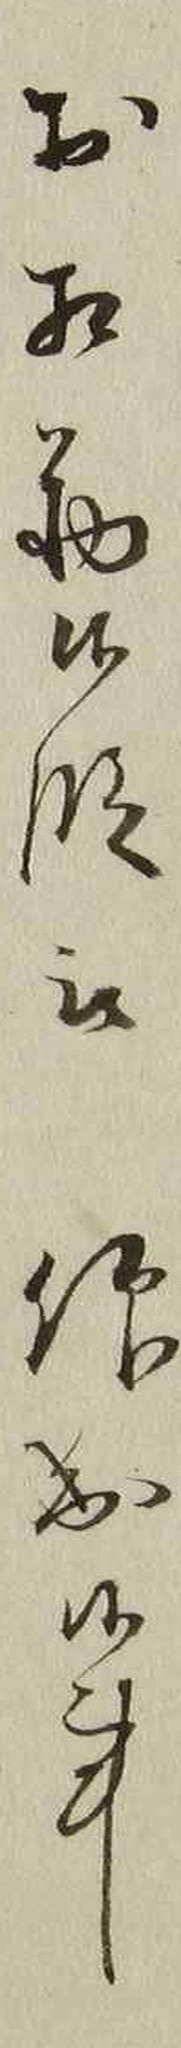出相勤候段被仰出候事
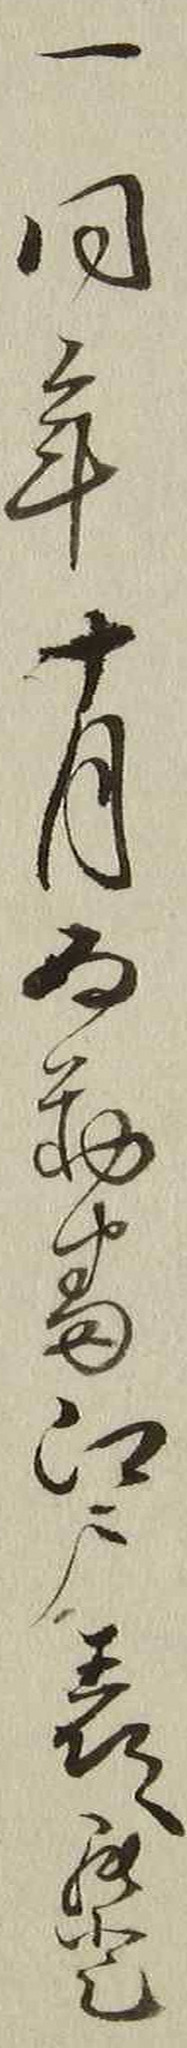一同年十月為勤番江戸表へ罷登
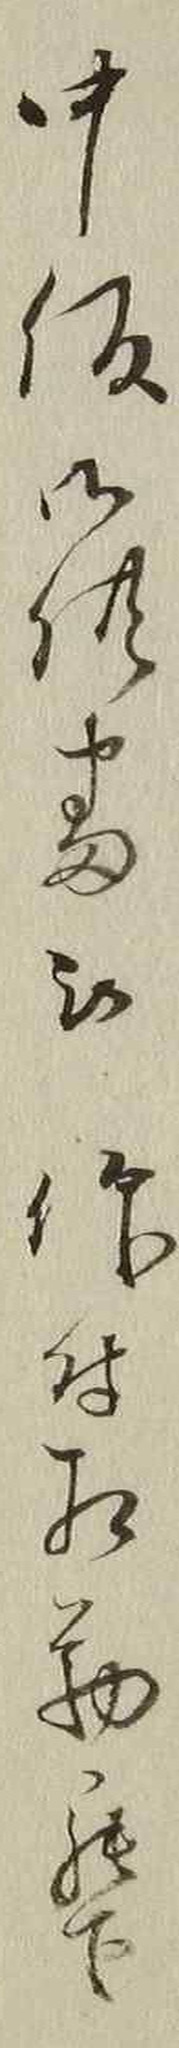中仮御供番被仰付相勤罷下
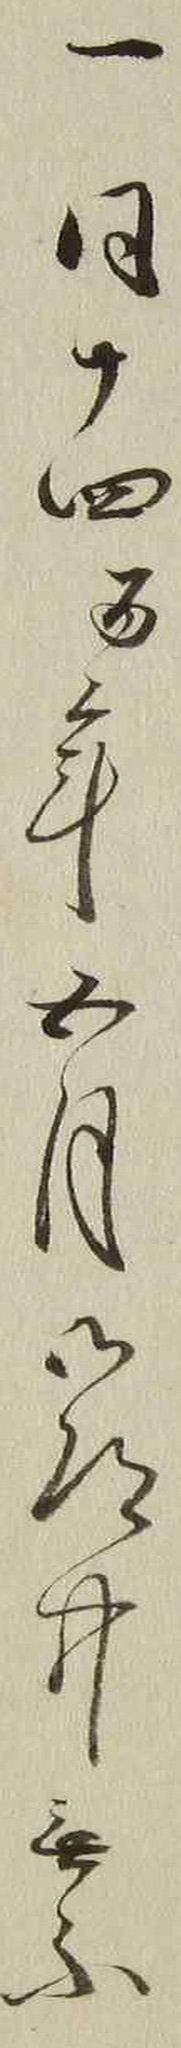一同十四酉年五月御道中無不
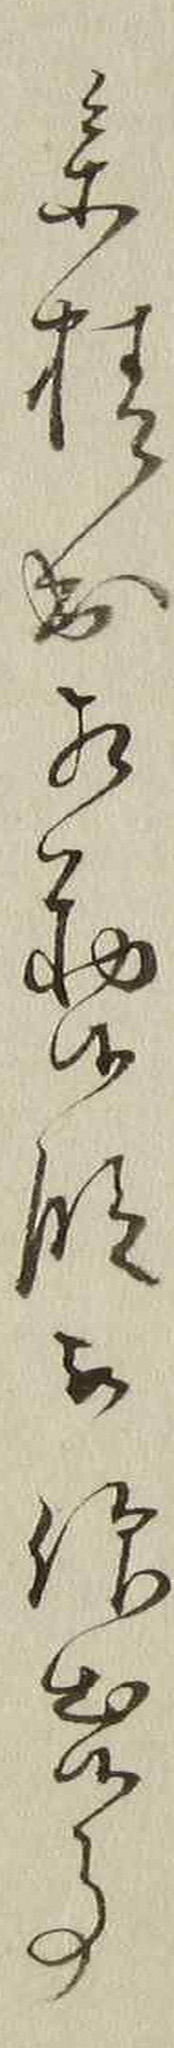参精出相勤候段被仰出候事
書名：諸士系譜　巻之129　た之部5
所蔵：会津若松市立会津図書館
